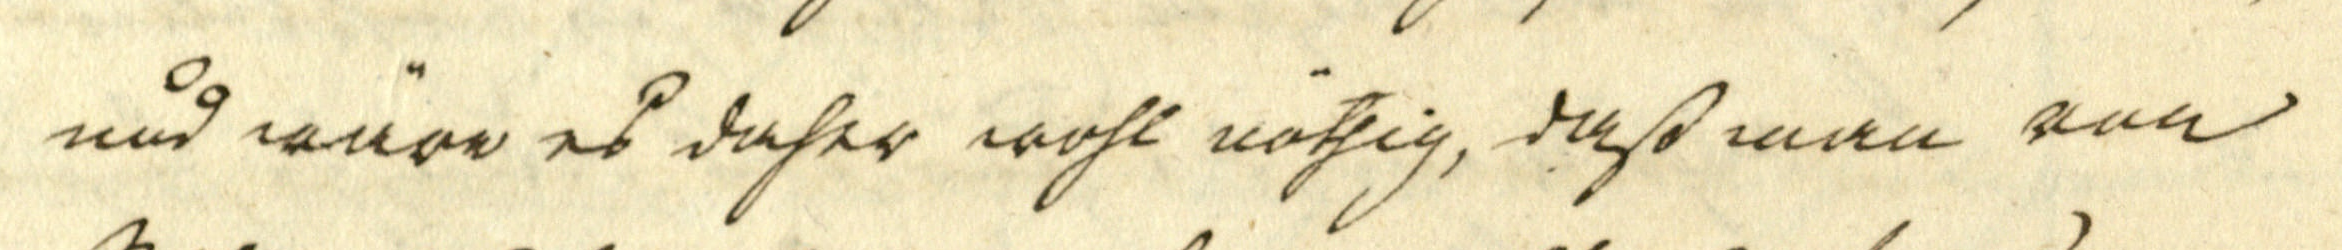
und wäre es daher wohl nöthig, daß man von
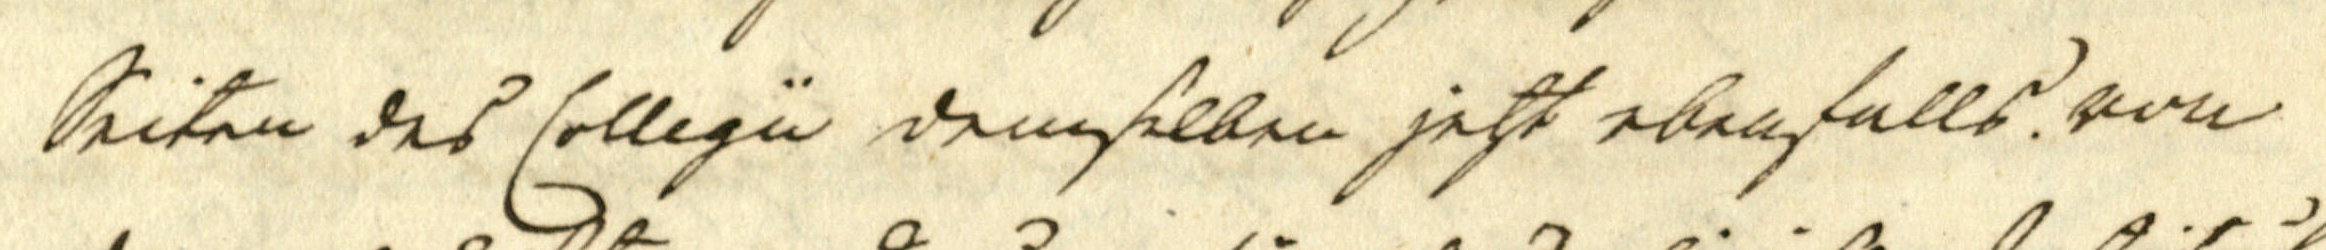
Seiten des Collegii demselben jetzt ebenfalls von
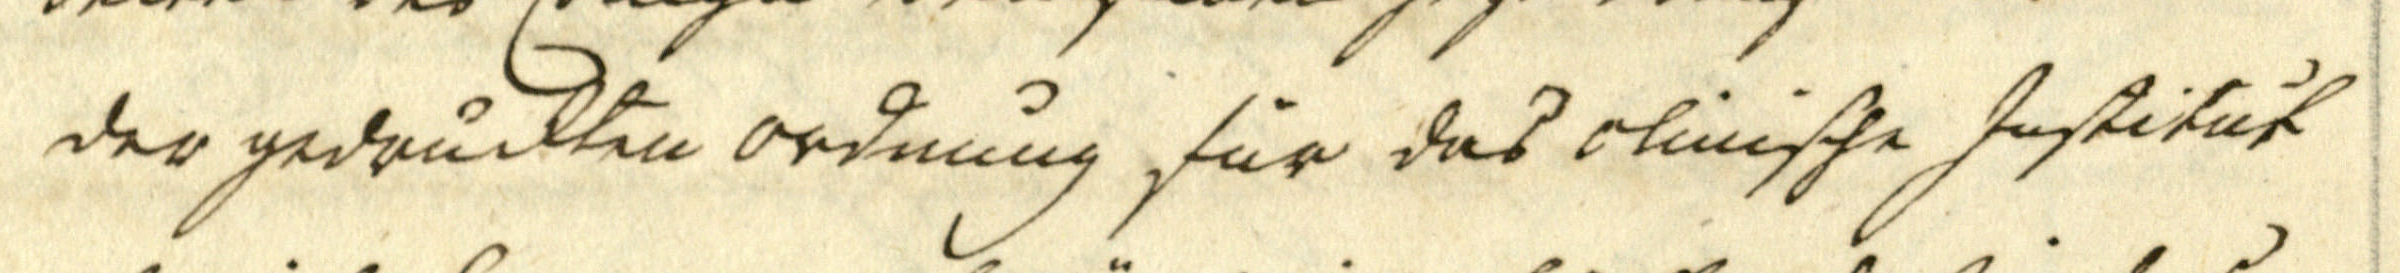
der gedruckten Ordnung für das clinische Institut
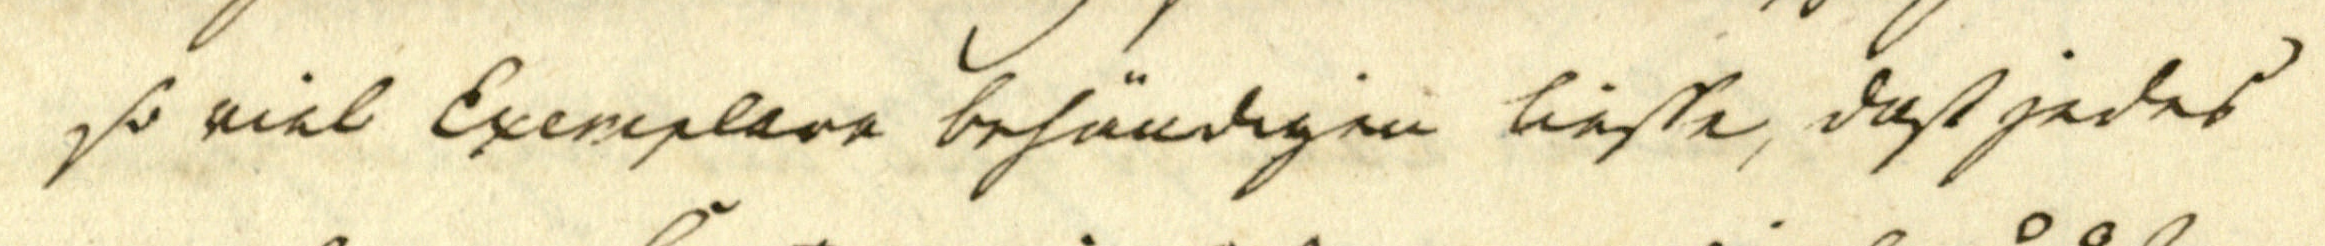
so viel Exemplare behändigen liesse, daß jedes
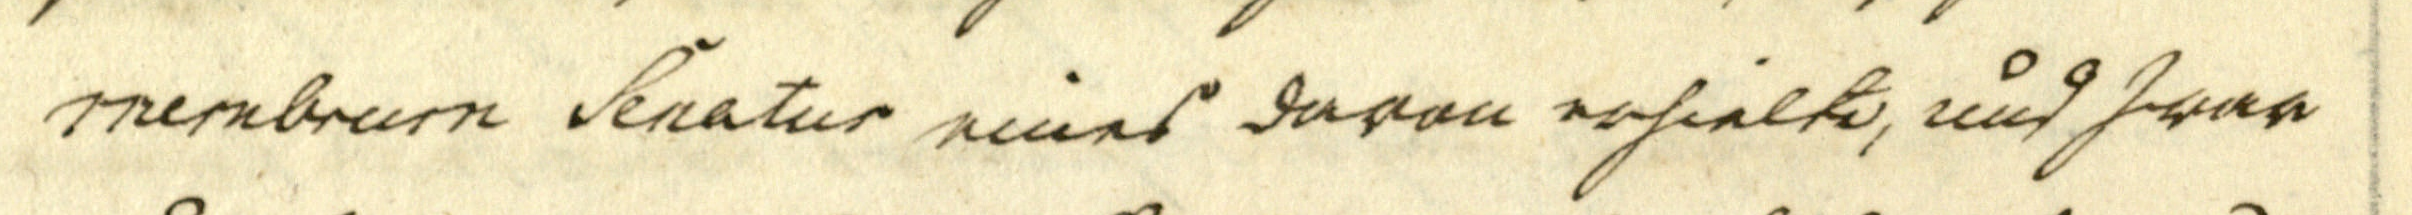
membrum Senatus eines davon erhielte, und zwar
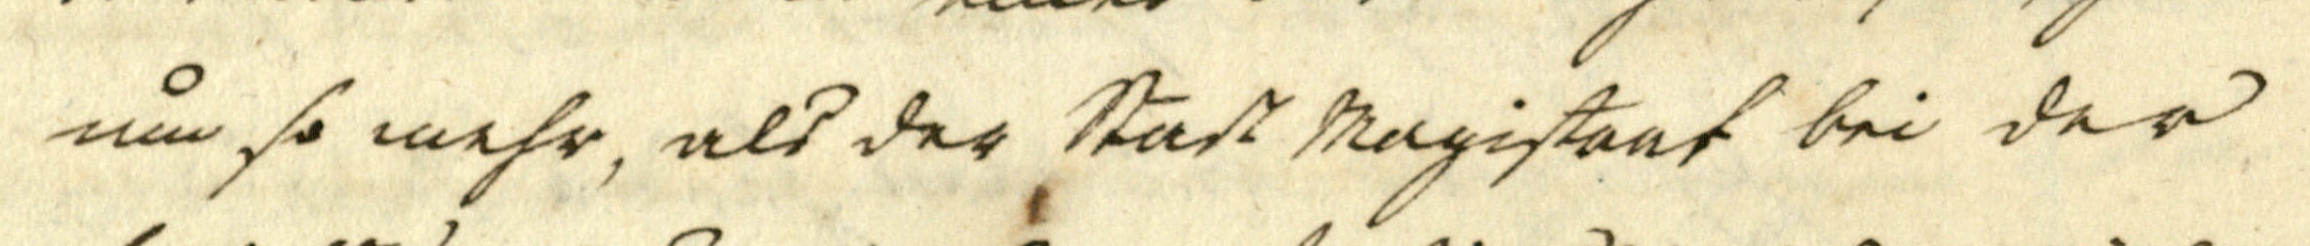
um so mehr, als der Stadt Magistrat bei der
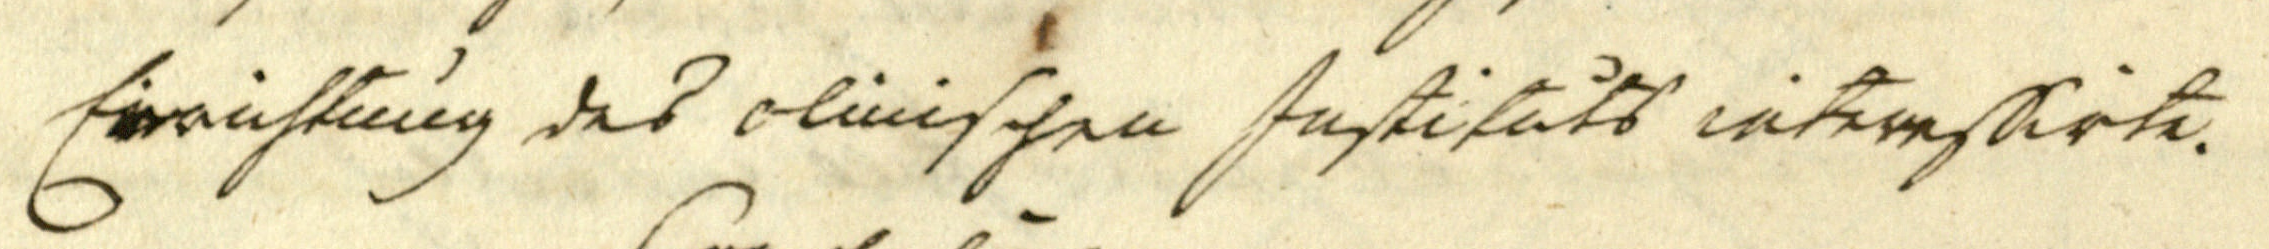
Errichtung des clinischen Instituts interessirte.
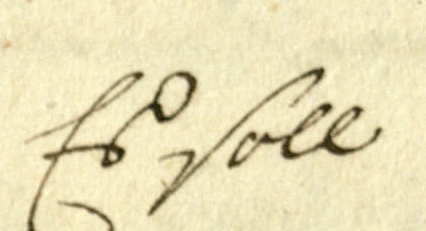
Es soll
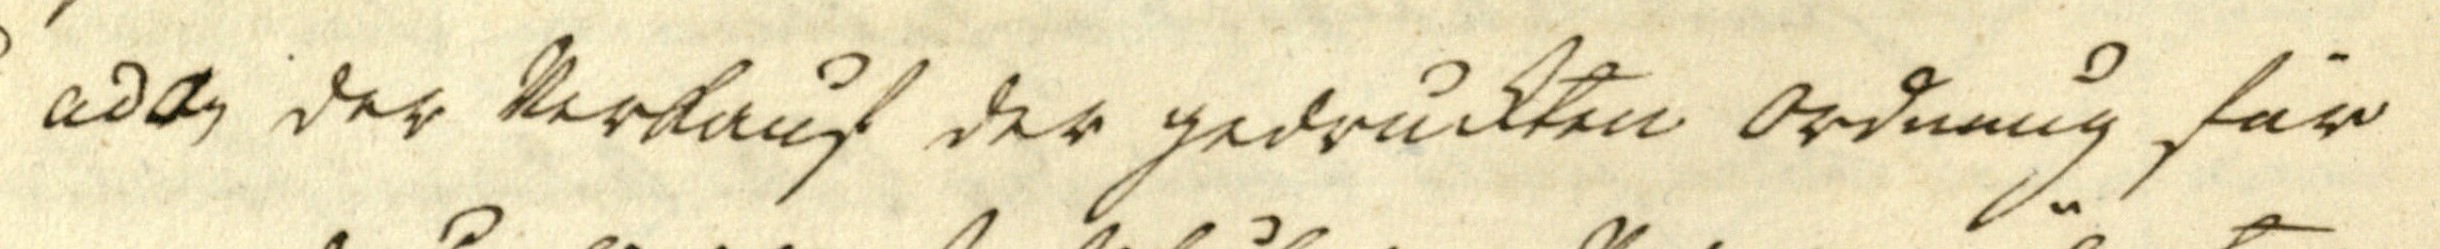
ad a, der Verkauf der gedruckten Ordnung für
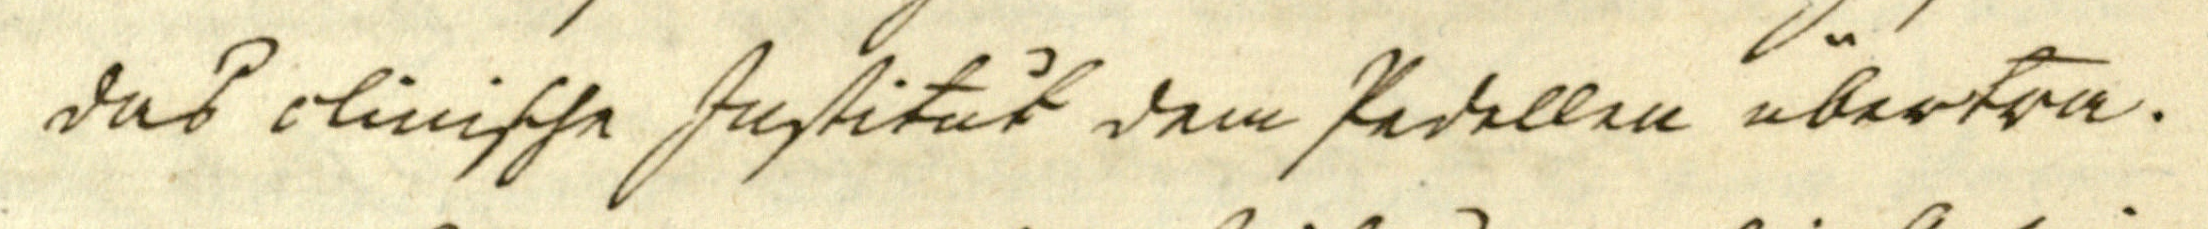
das clinische Institut dem Pedellen übertra¬
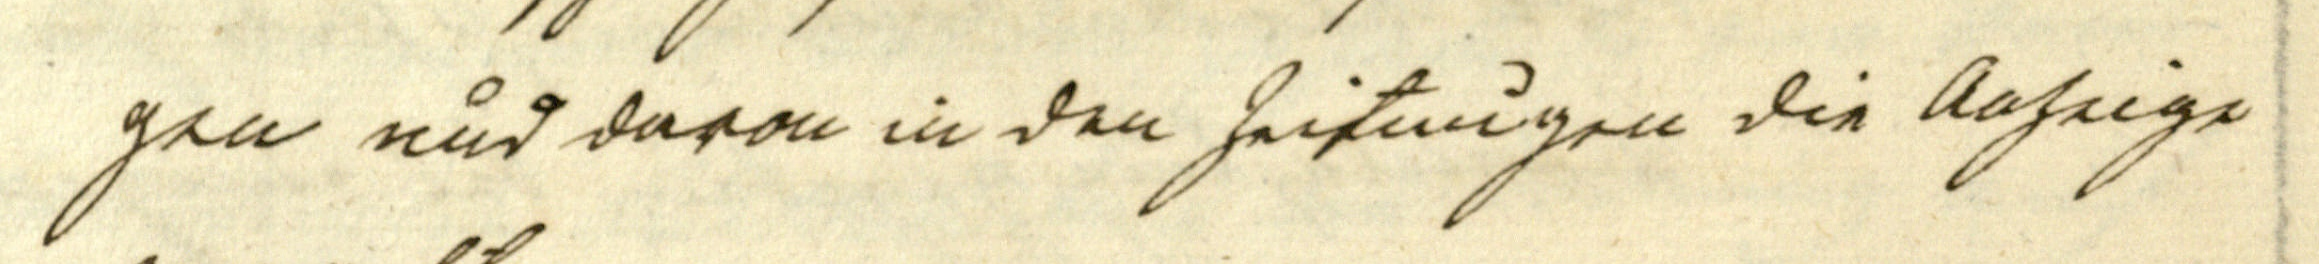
gen und davon in den Zeitungen die Anzeige
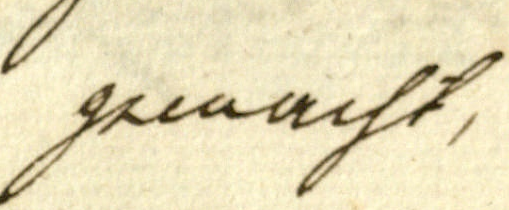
gemacht,
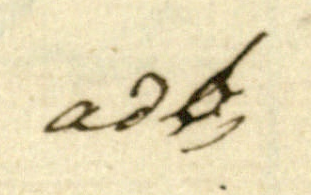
ad b,
